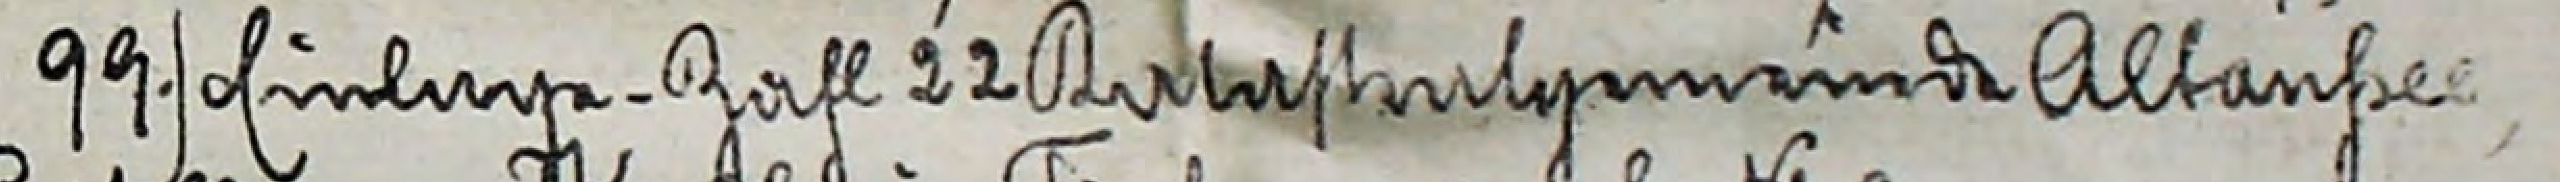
99.) Einlage - Zahl 22 Katastralgemeinde Altaussee,
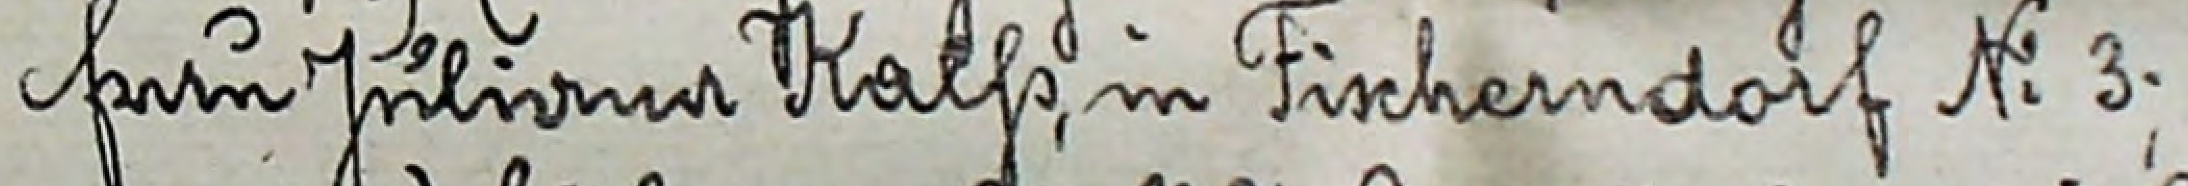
Frau Juliana Kalhs, in Fischerndorf № 3;
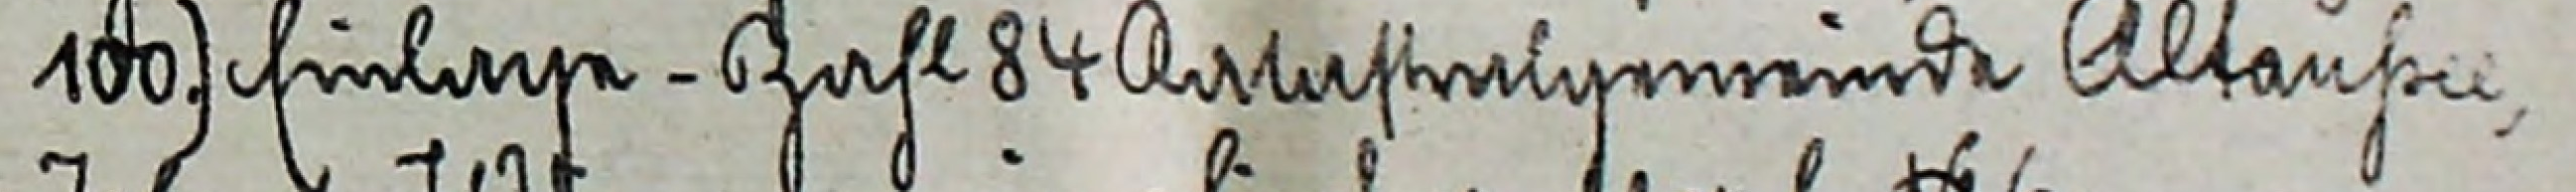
100.) Einlage - Zahl 84 Katastralgemeinde Altaussee,
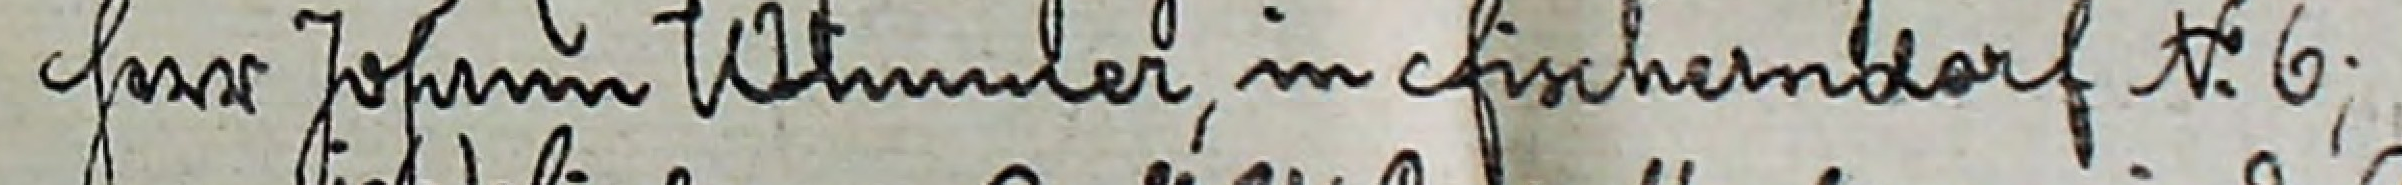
Herr Johann Wimmer, in Fischerndorf № 6;
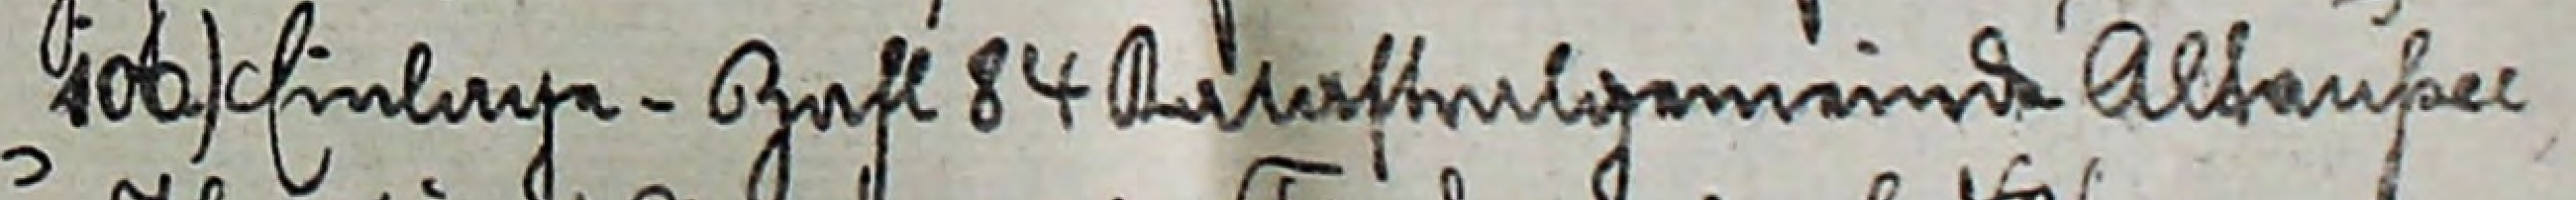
100.) Einlage - Zahl 84 Katastralgemeinde Altaussee,
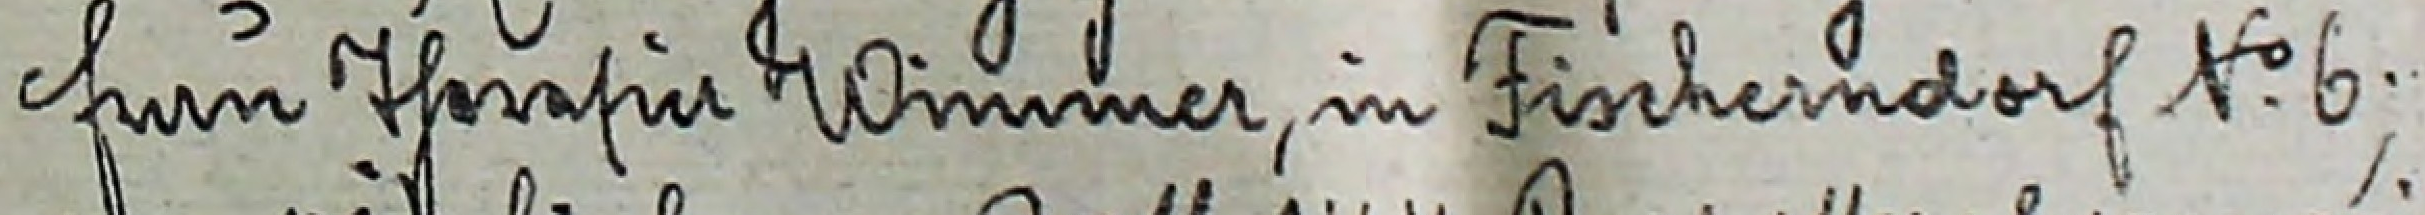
Frau Theresia Wimmer, in Fischerndorf № 6;
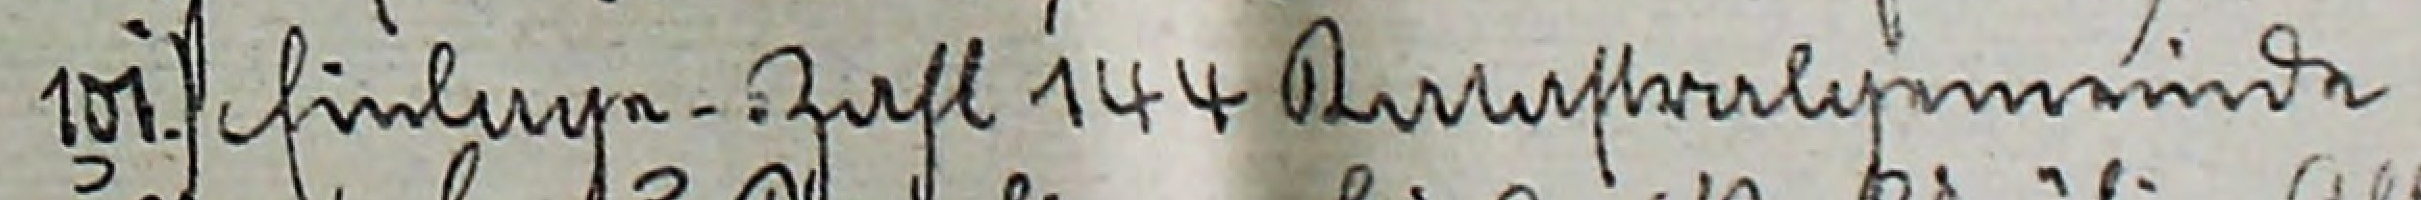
101.) Einlage - Zahl 144 Katastralgemeinde
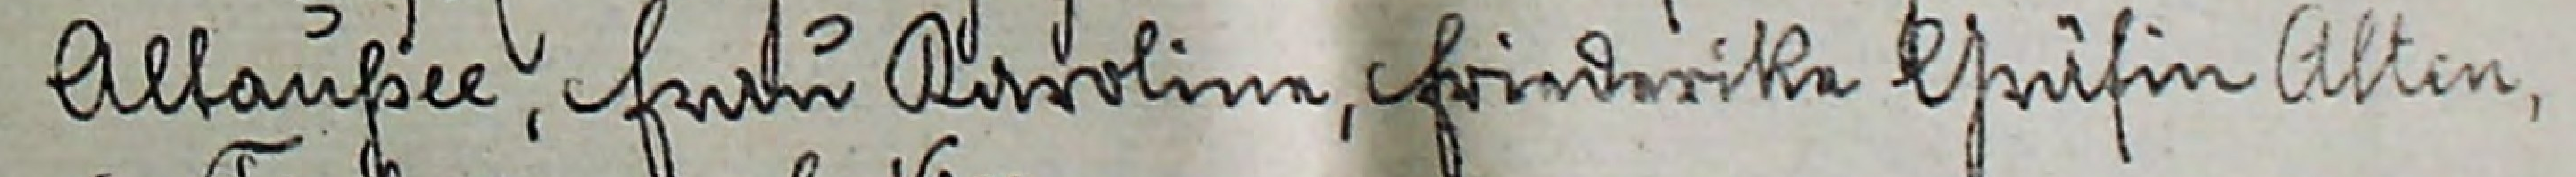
Altaussee, Frau Karoline, Friederike Gräfin Alten,
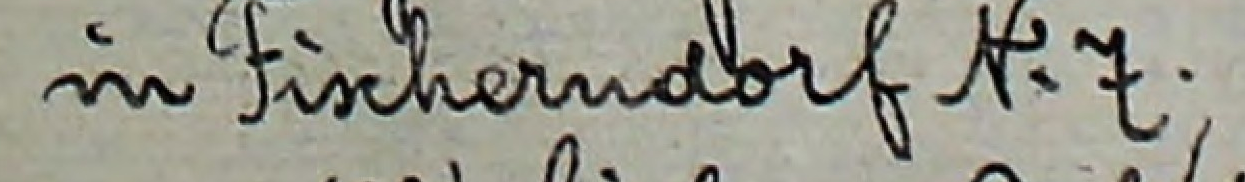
in Fischerndorf № 7;
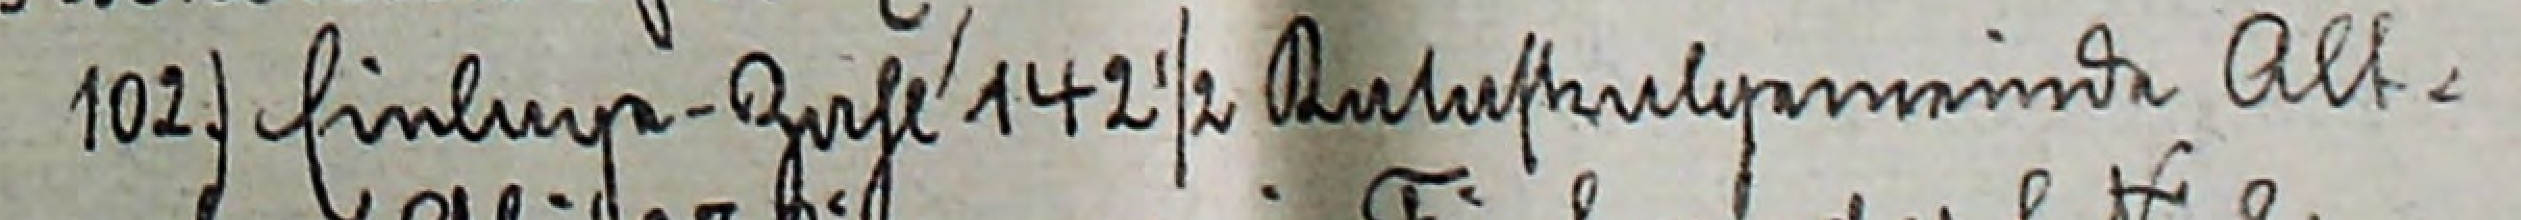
102.) Einlage - Zahl 142 1/2 Katastralgemeinde Alt=
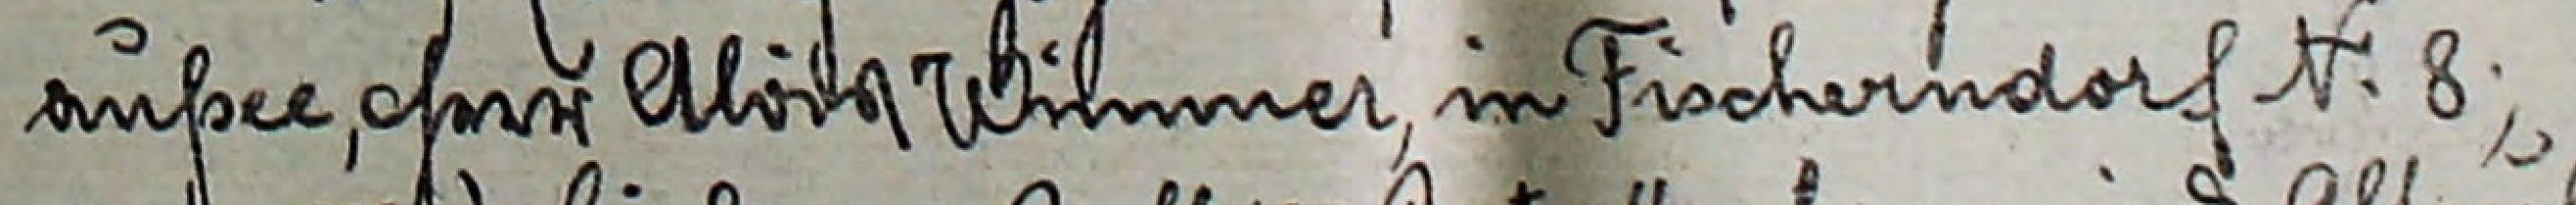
aussee, Frau Alois Wimmer, in Fischerndorf № 8;
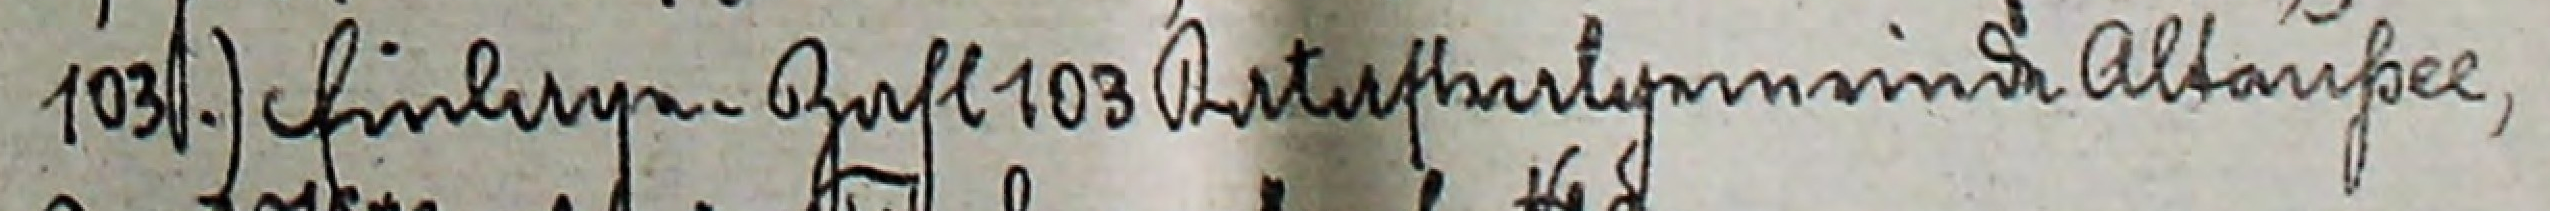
103.) Einlage - Zahl 103 Katastralgemeinde Altaussee,
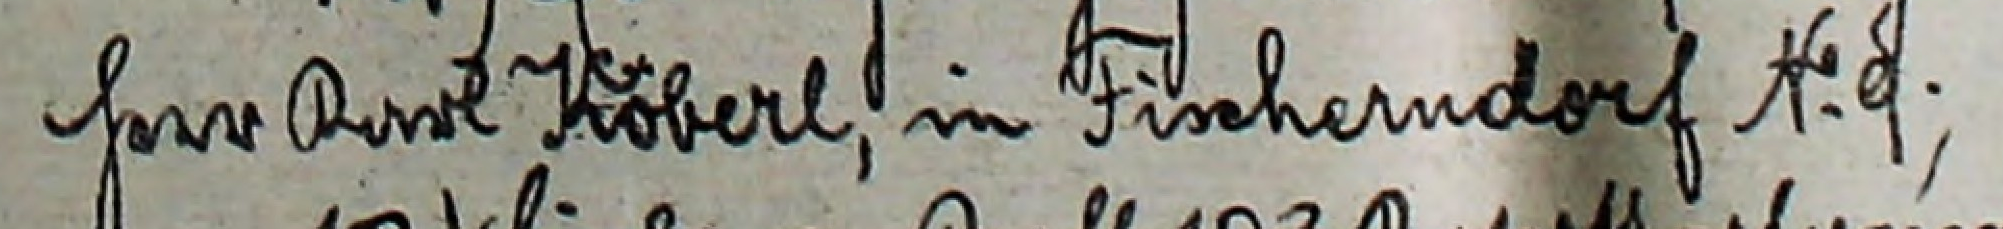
Herr Karl Köberl, in Fischerndorf № 9;
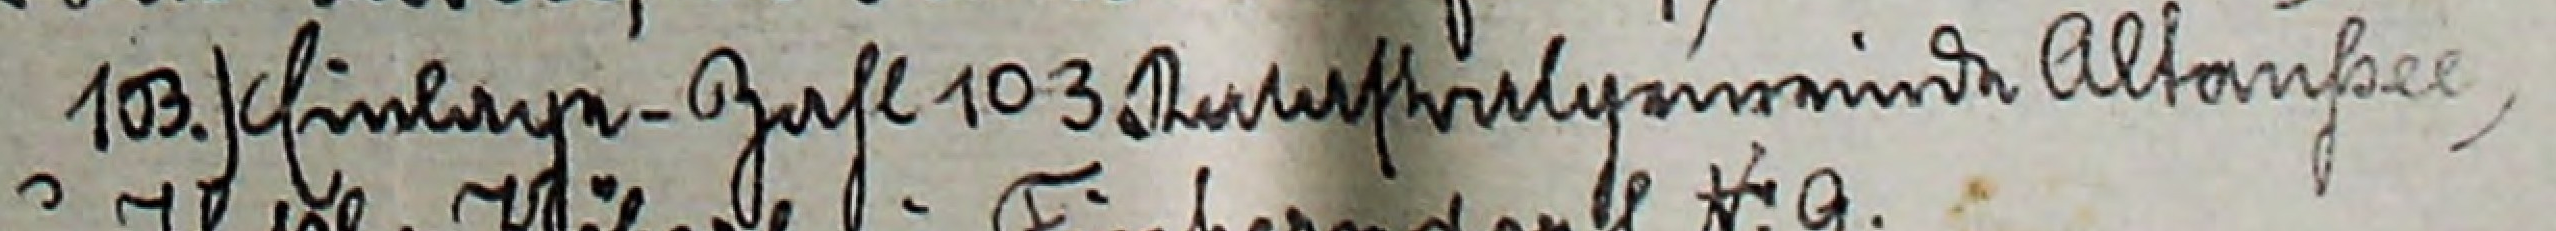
103.) Einlage - Zahl 103 Katastralgemeinde Altaussee,
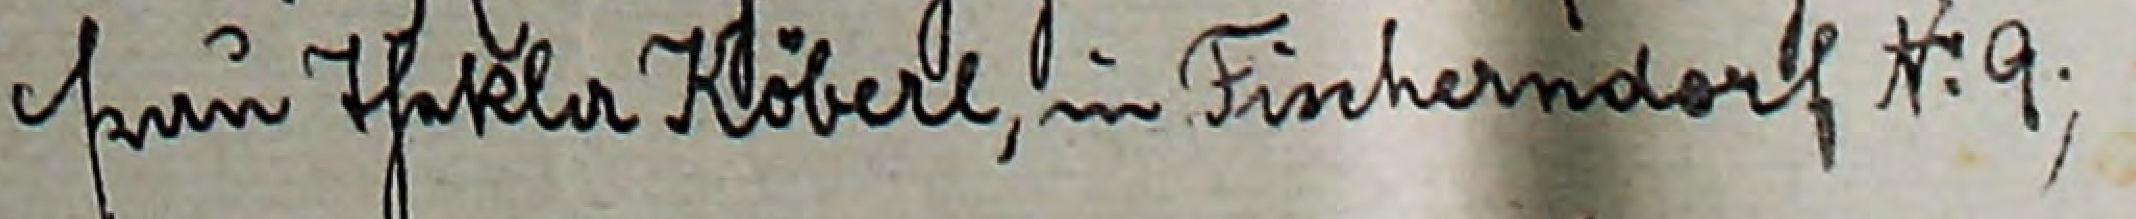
Frau Thekla Köberl, in Fischerndorf № 9;
